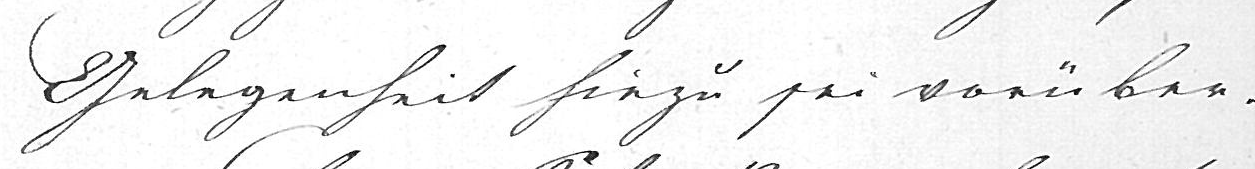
Gelegenheit hiezu sei vorüber.
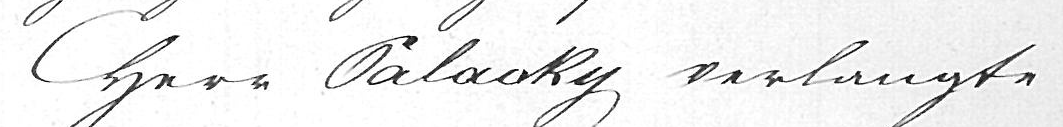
Herr Palacky verlangte
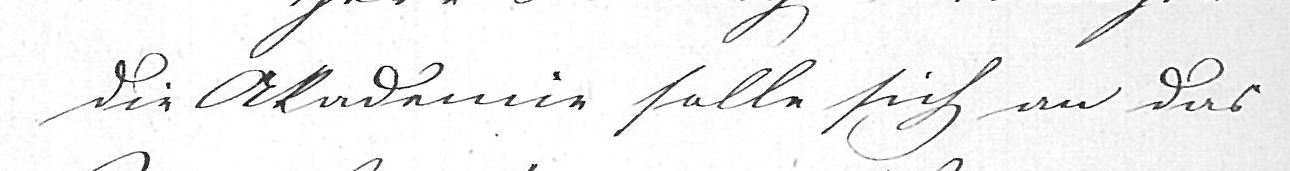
die Akademie solle sich an das
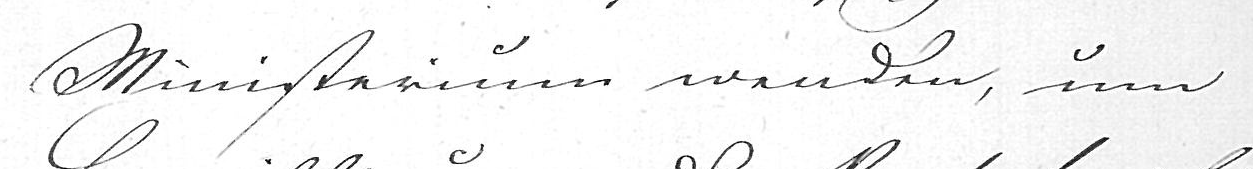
Ministerium wenden, um
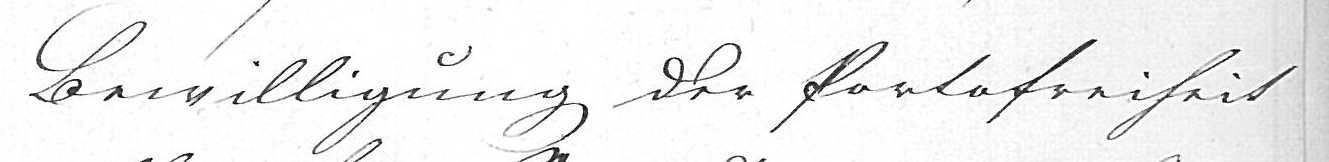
Bewilligung der Portofreiheit
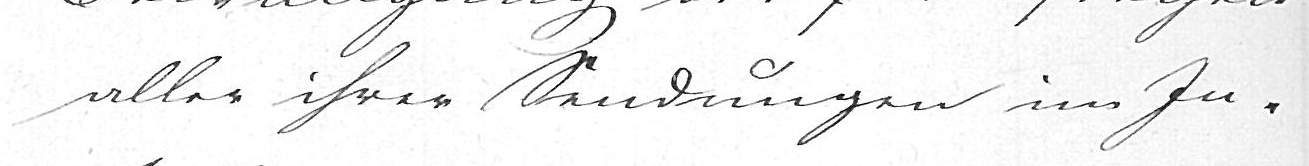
aller ihrer Sendungen im In-
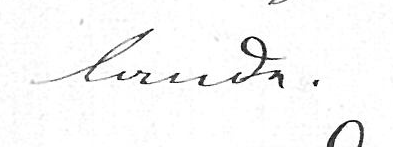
lande.
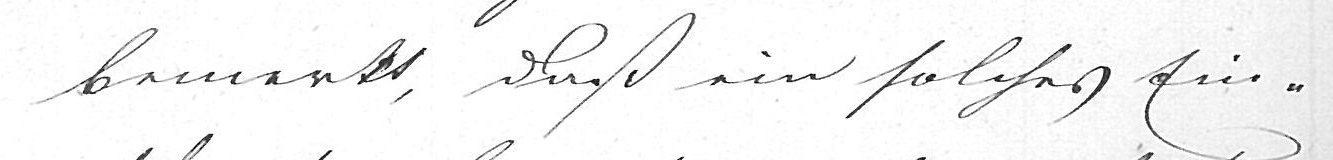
bemerkt, daß ein solches Ein-
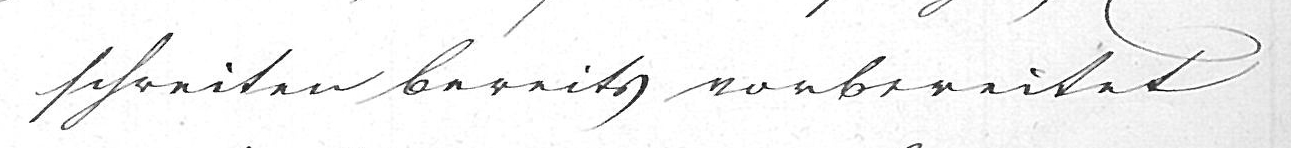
schreiten bereits vorbereitet
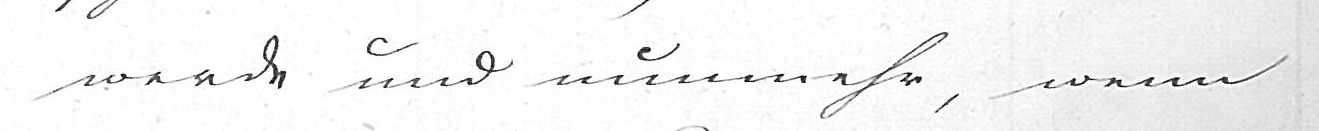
werde und nunmehr, wenn
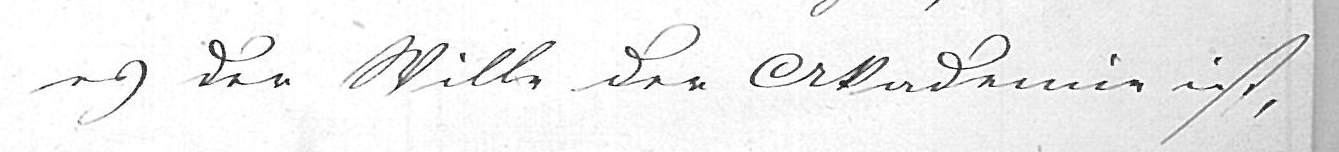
es der Wille der Akademie ist,
